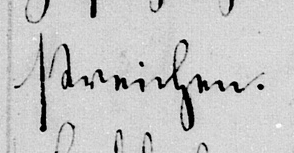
streichen.
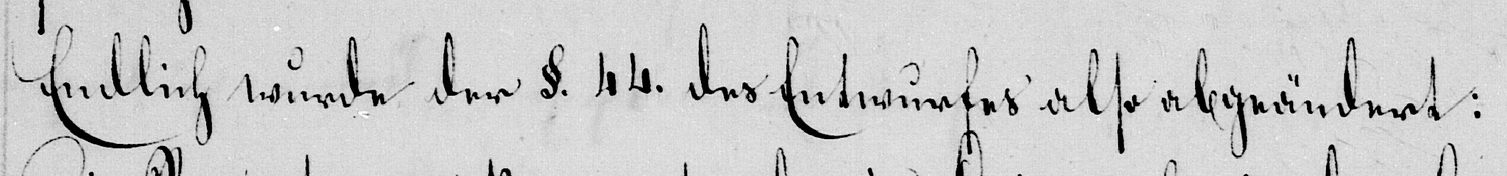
Endlich wurde der §. 44. des Entwurfes also abgeändert:
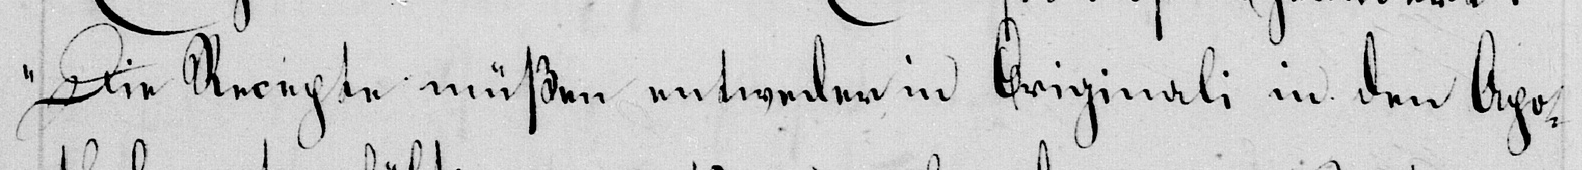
„Die Recepte müßen entweder in Originali in den Apo¬
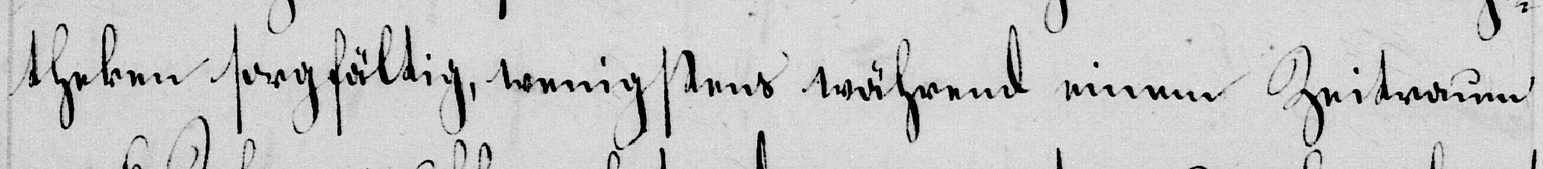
theken sorgfältig, wenigstens während einem Zeitraum
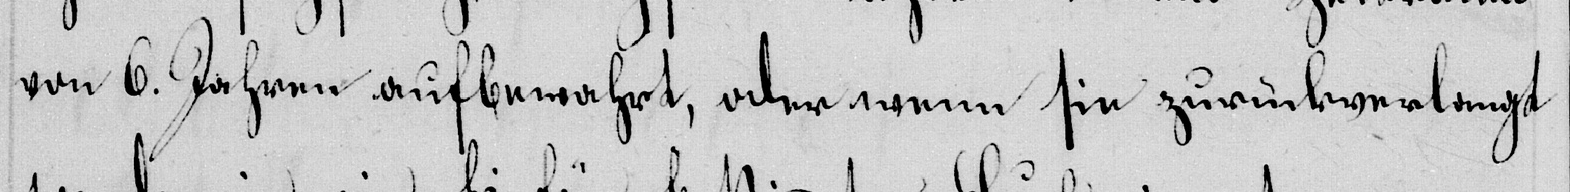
von 6. Jahren aufbewahrt, oder wenn sie zurückverlangt
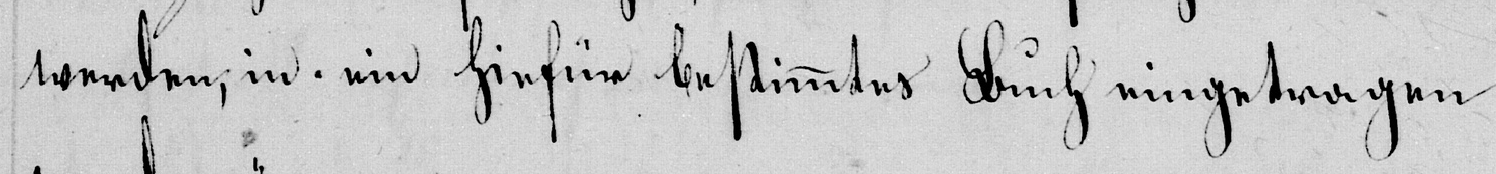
werden, in ein hiefür bestimmtes Buch eingetragen
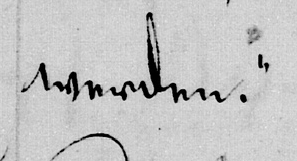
werden.“
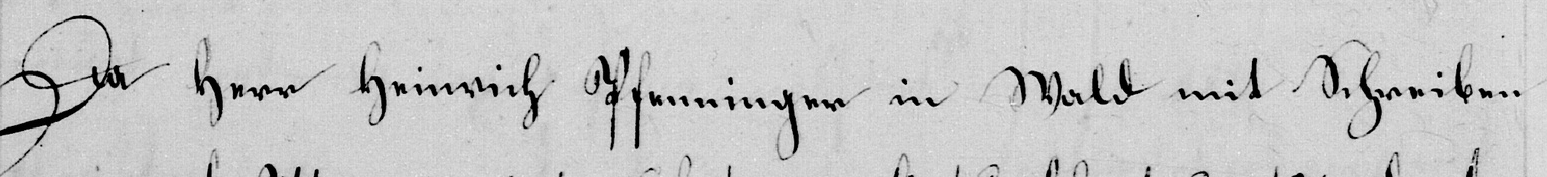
Da Herr Heinrich Pfenninger in Wald mit Schreiben
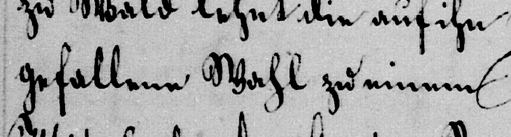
gefallene Wahl zu einem
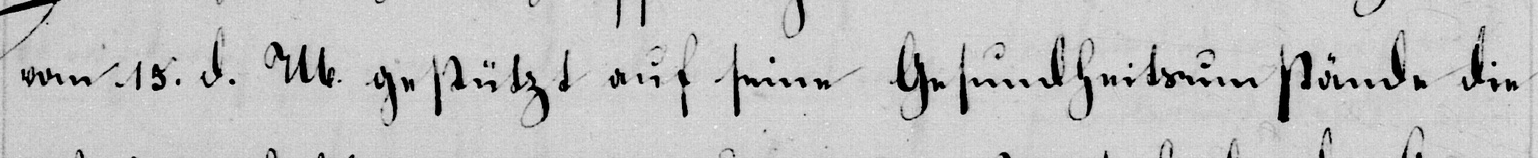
vom 15. d. M. gestützt auf seine Gesundheitsumstände die
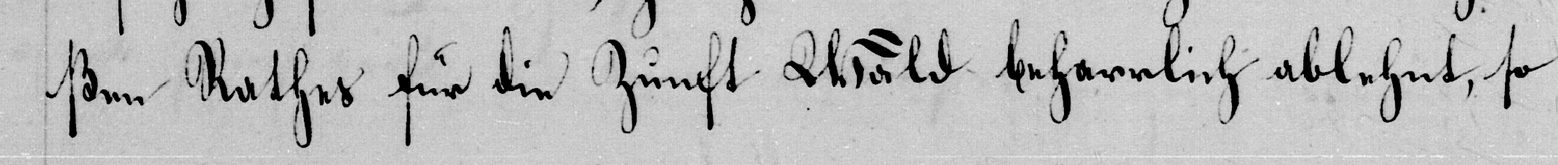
en Rathes für die Zunft Wald beharrlich ablehnt, so
